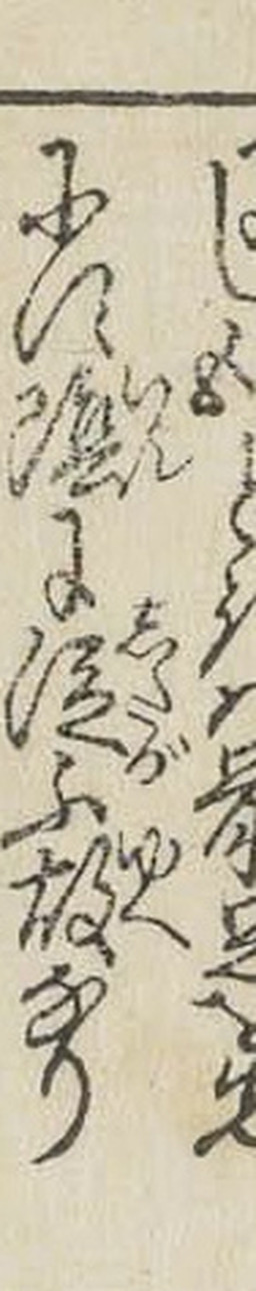にす陰に従ふ故なり
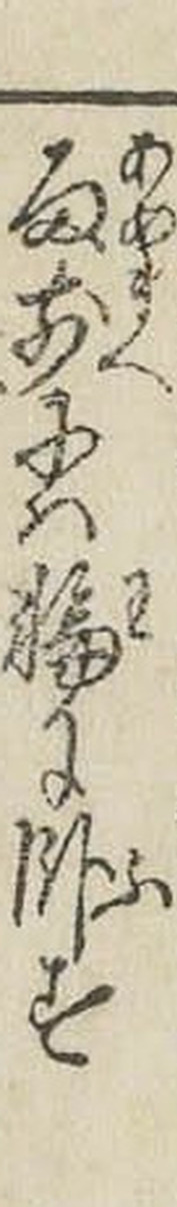雨前には輪に臥す
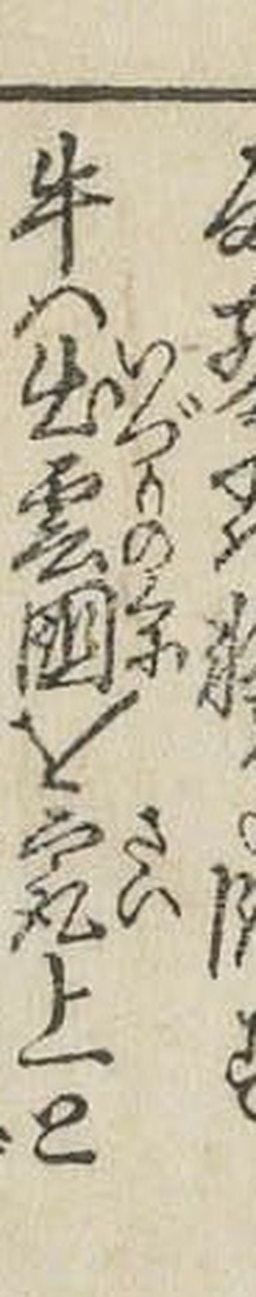牛は出雲国を最上と
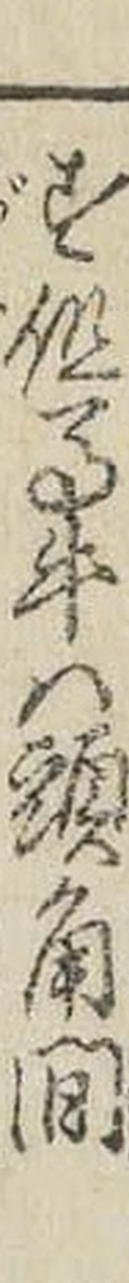す但馬牛は頭角間
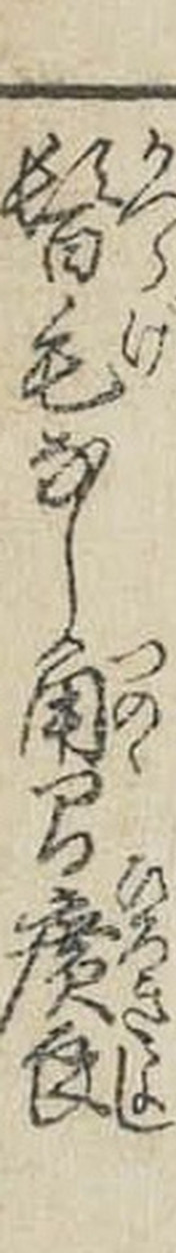𩭈毛なし角間広良
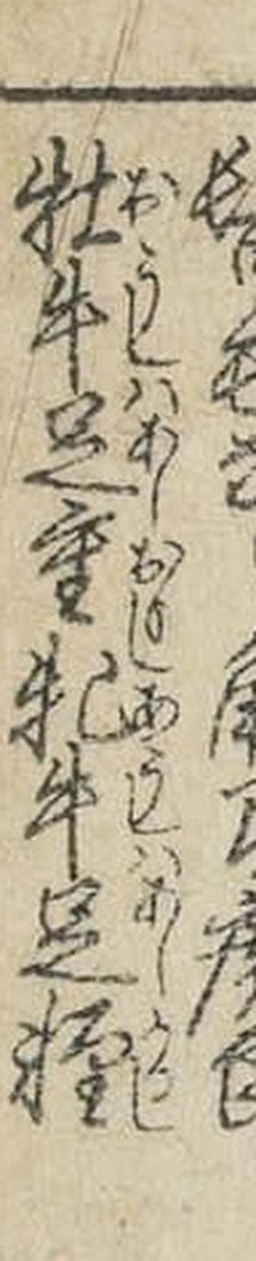牡牛は足重牝牛は足軽

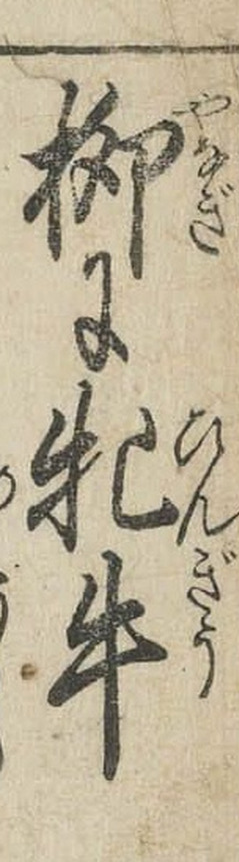柳に牝牛
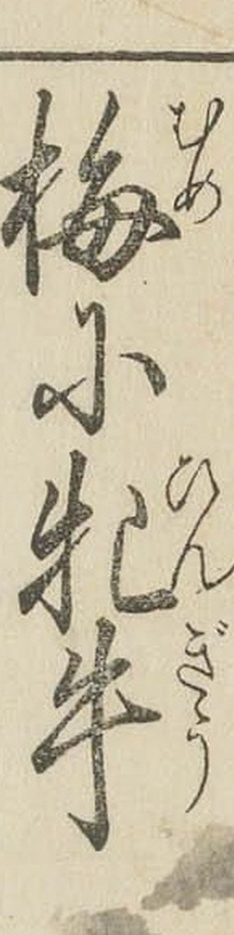梅に牝牛

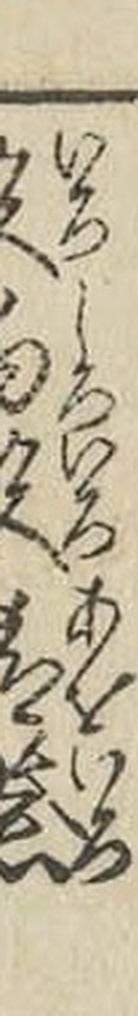色白色青蒼
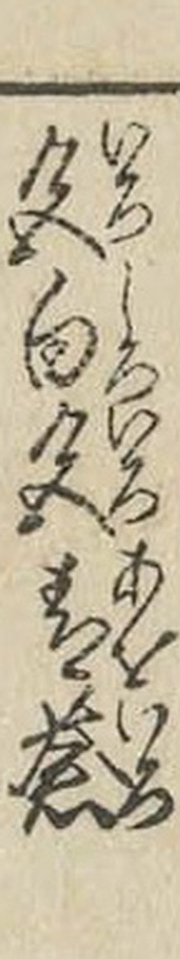色白色青蒼
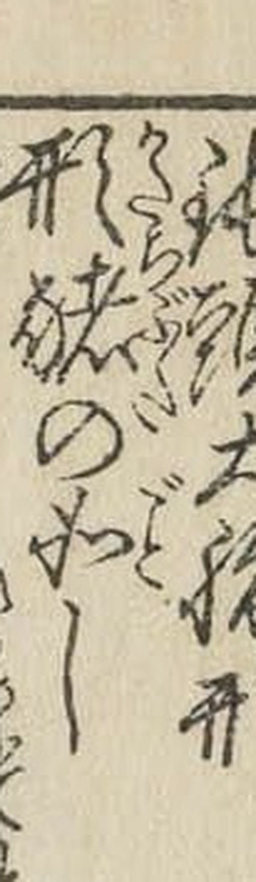形猪の如し
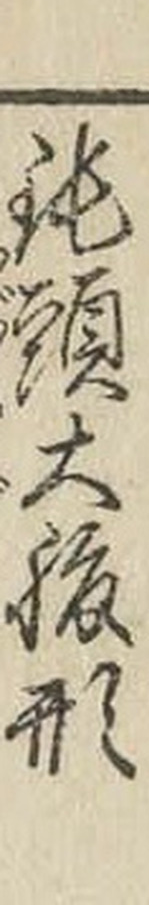鈍頭大腹形
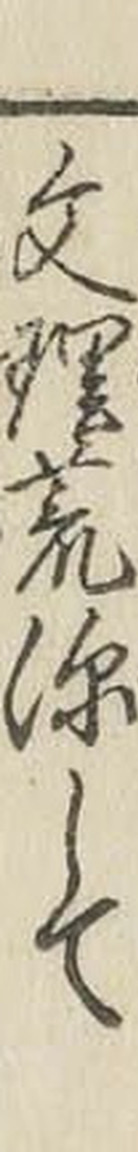文理荒深して
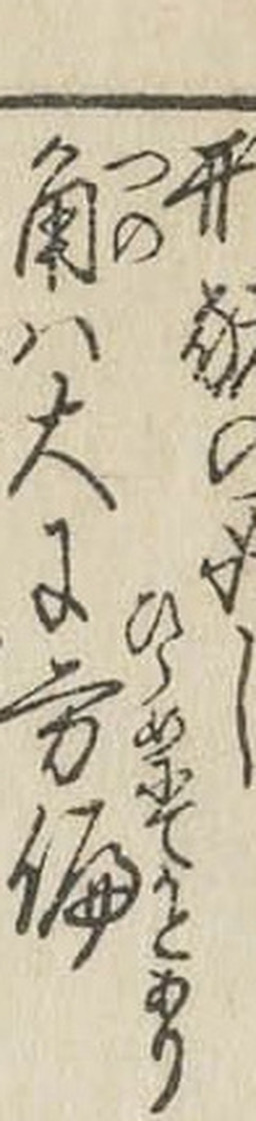角は大に方偏
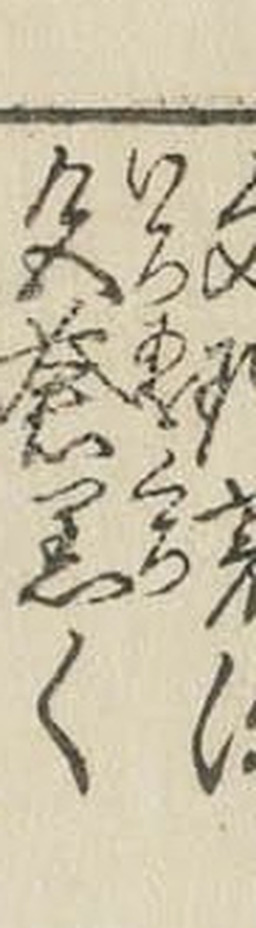色蒼黒く
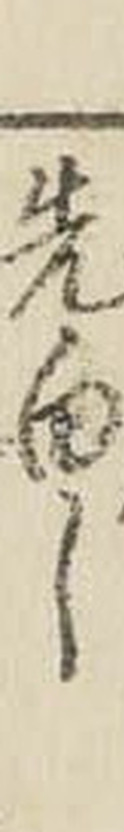先白し
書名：絵本写宝袋 9巻 9之巻下
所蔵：東京学芸大学教育コンテンツアーカイブ
